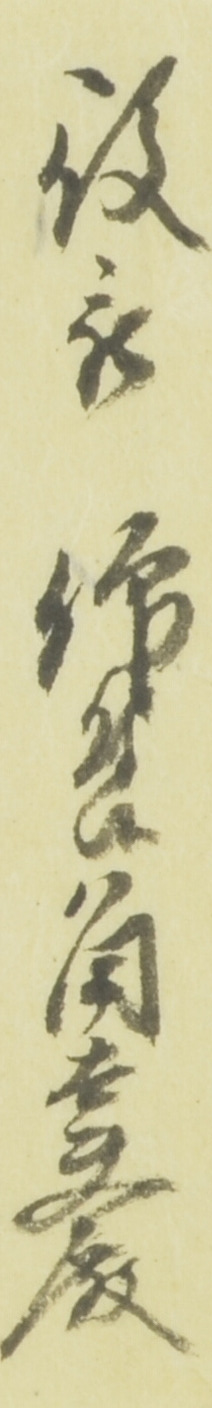役被仰付候角太夫殿
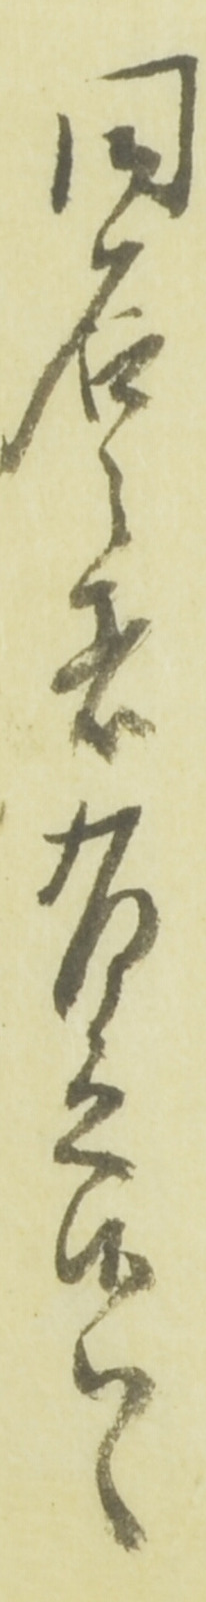同名之者有之候ハヽ
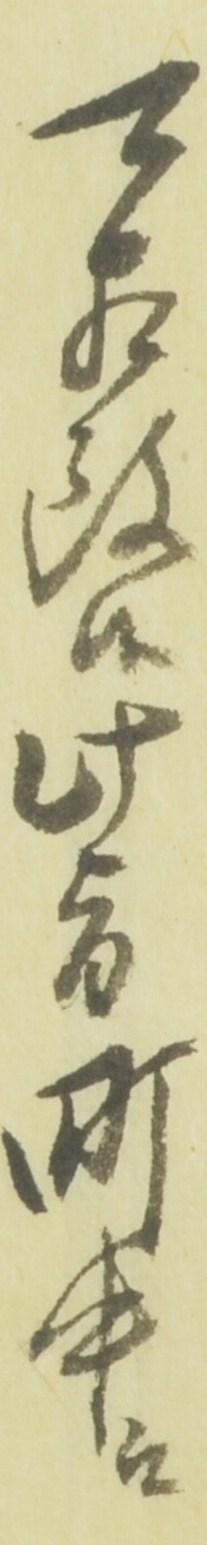可相改候此旨町中江
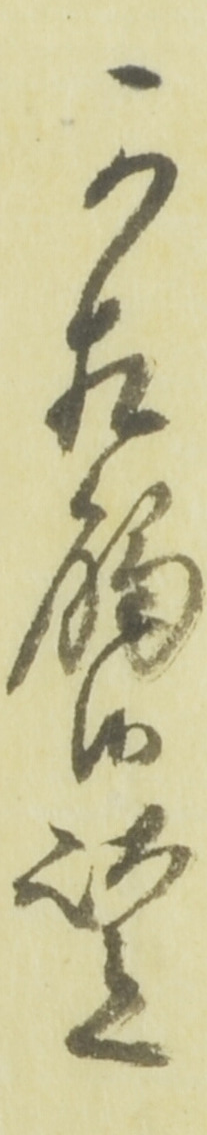可相触候以上
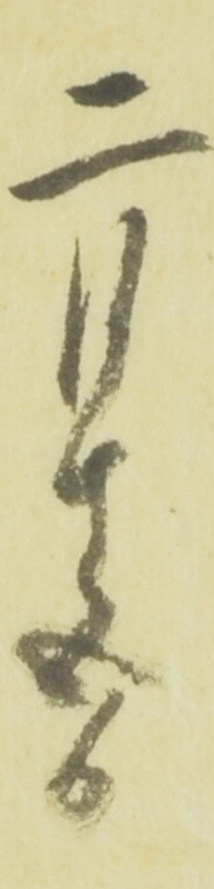二月十五日
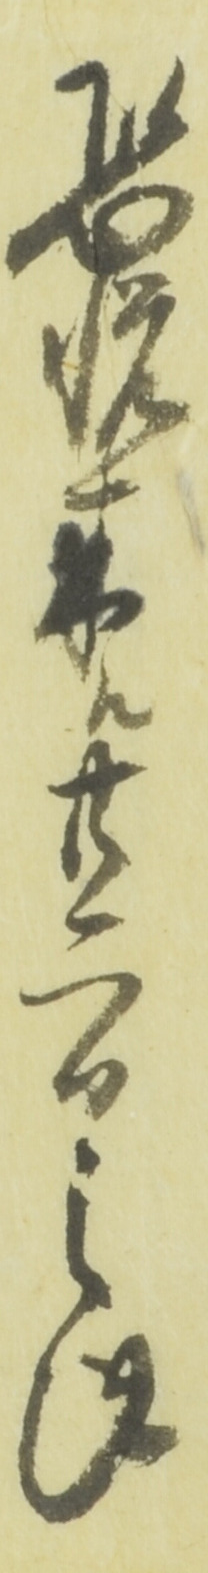恐悦来ル廿二日之趣
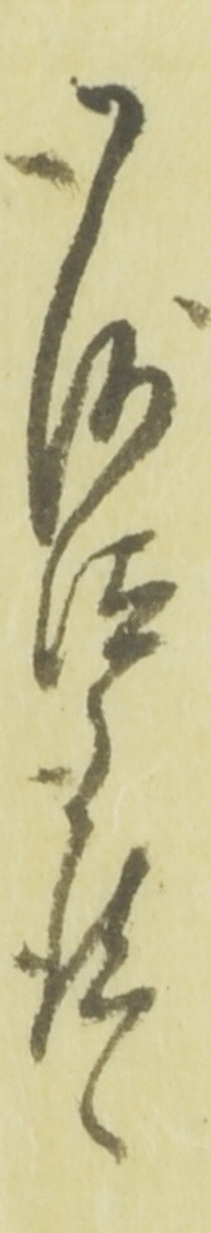御沙汰御座候
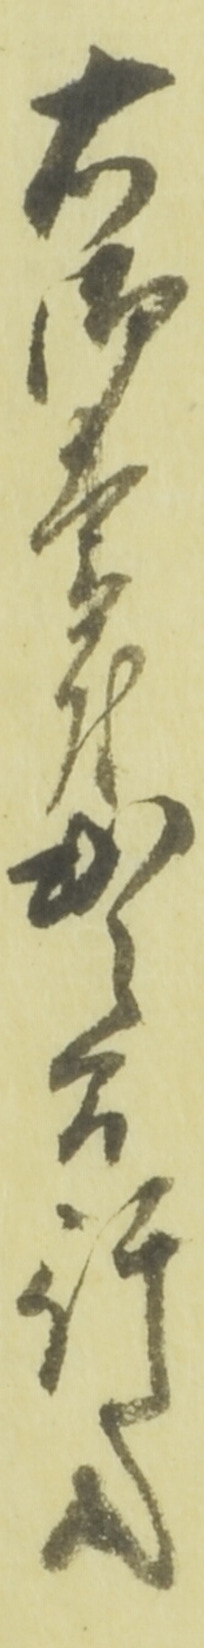右御書付出候間行司
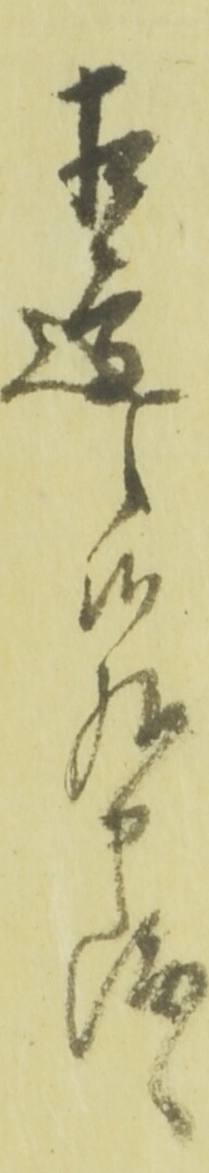相違之候様申渡候
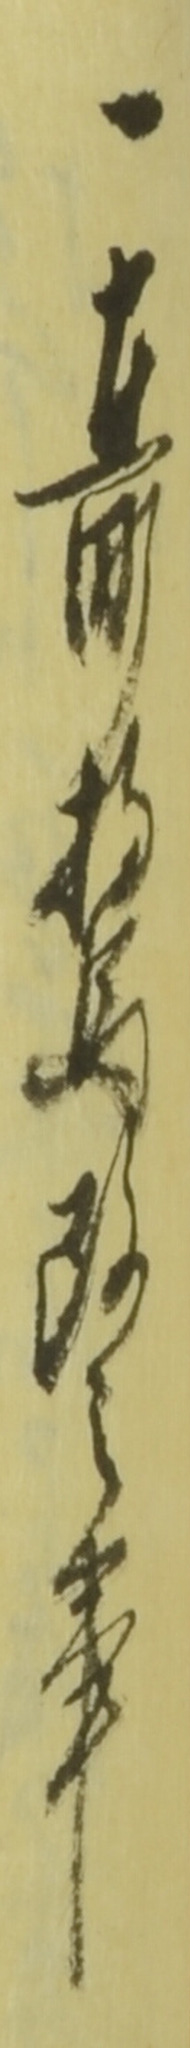一在町持馬改之事
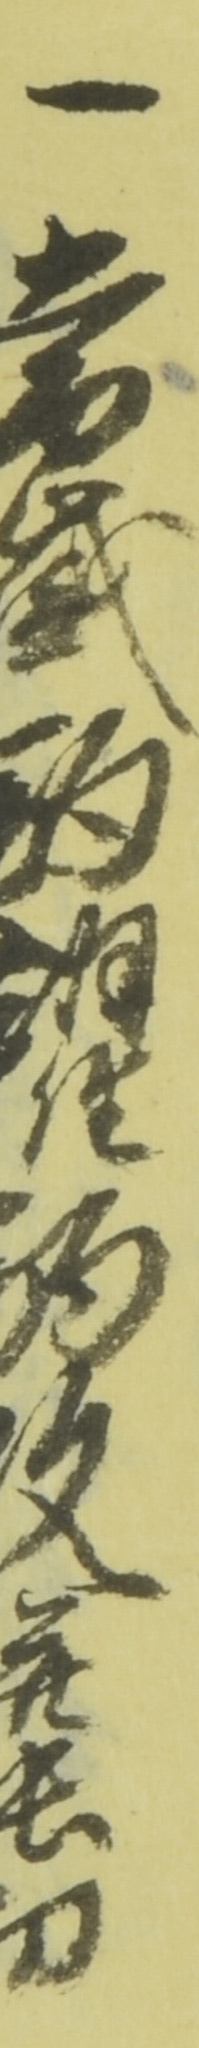一当歳駒糶駒改并帳切

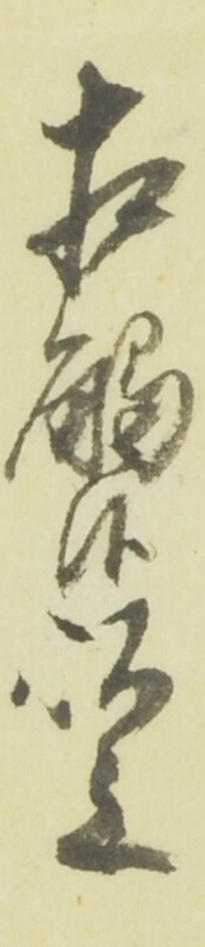相触候以上
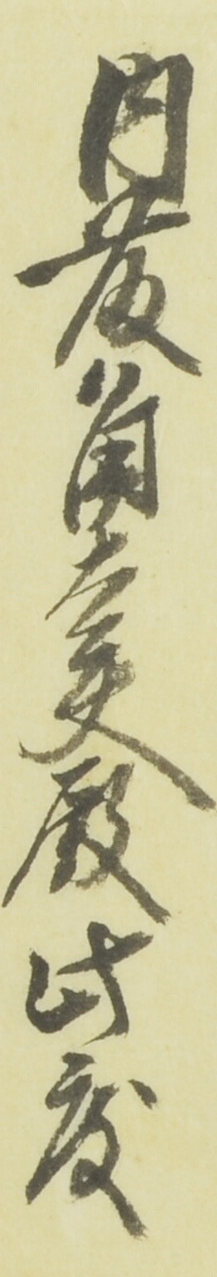内藤角太夫殿此度
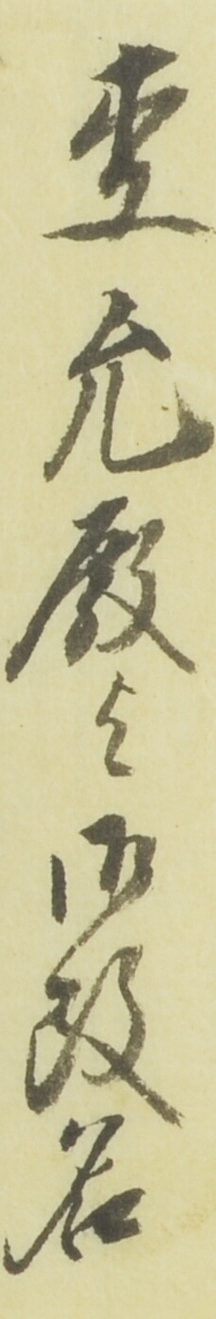杢允殿と御改名
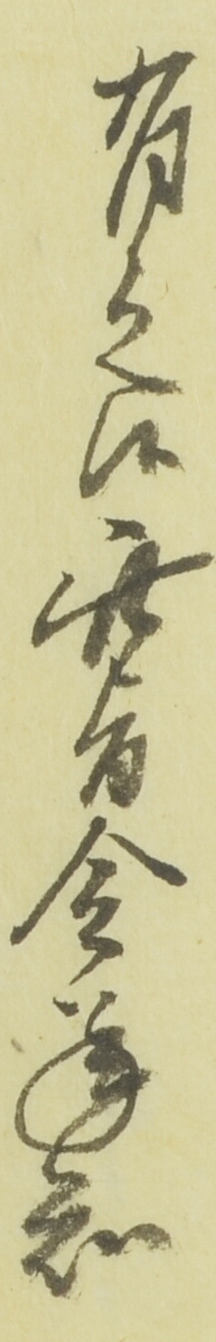有之候此旨合承知
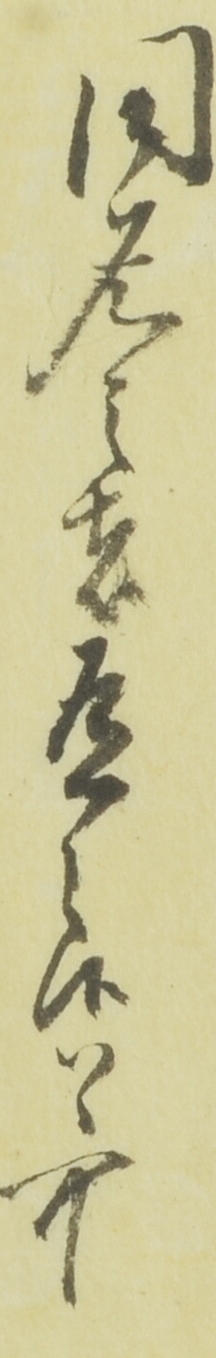同名之者有之候ハヽ可
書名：御触書御書附控
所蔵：伊那市立高遠町図書館・合同会社AMANE
